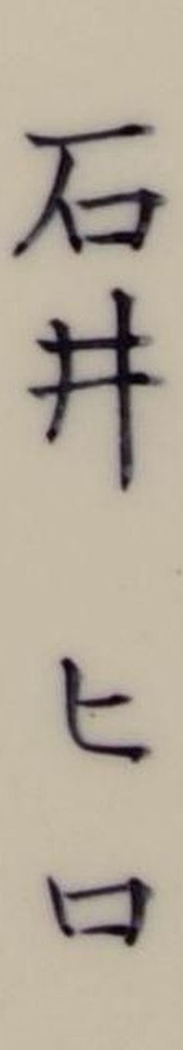石井ヒ口
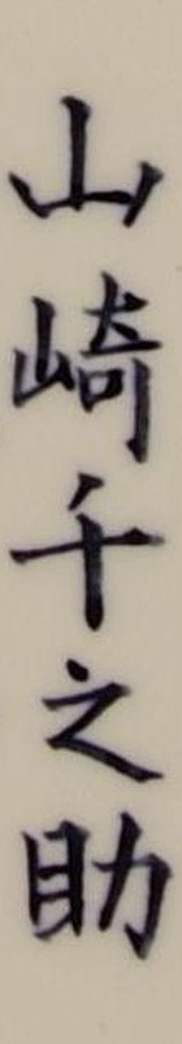山崎千之助
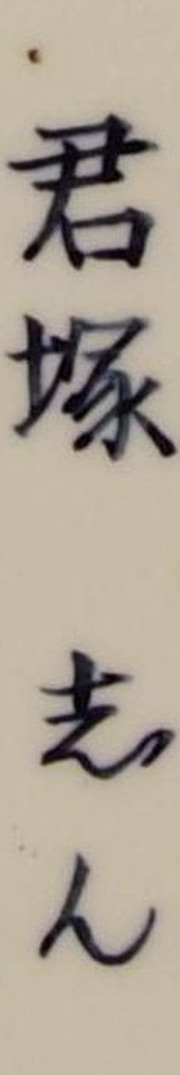君塚しん
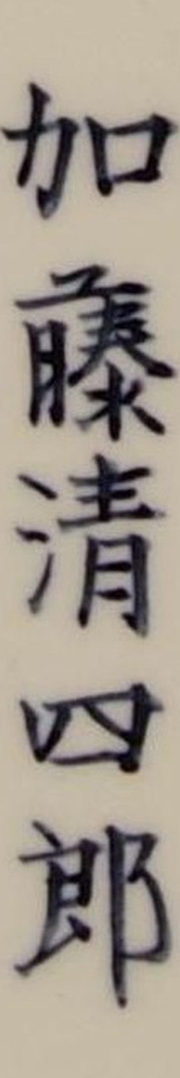加藤清四郎
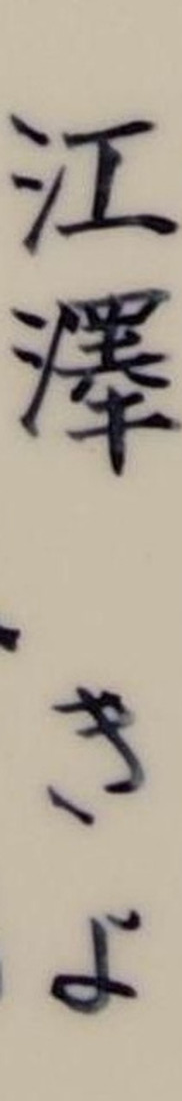江澤きよ
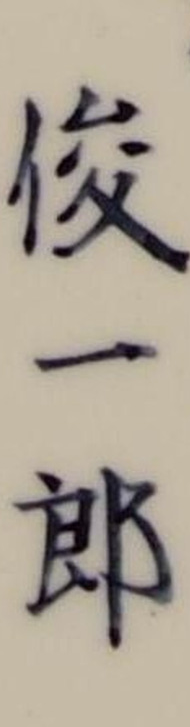俊一郎
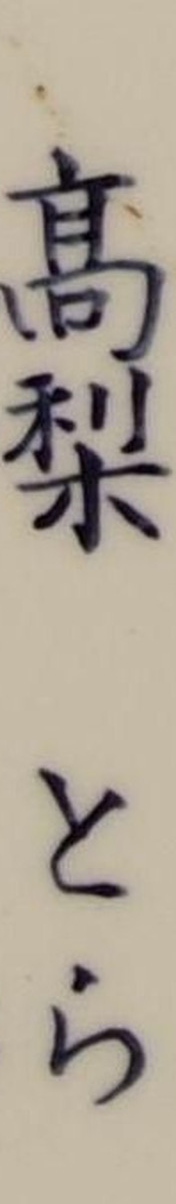高梨とら
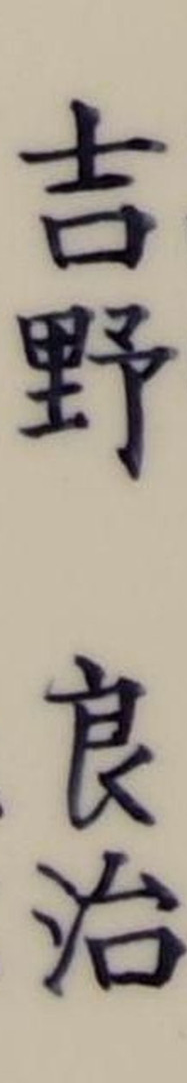吉野良治
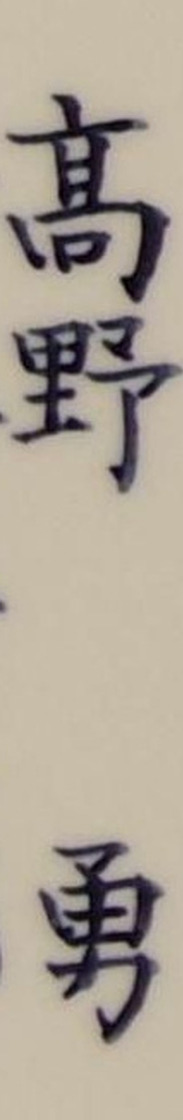高野勇
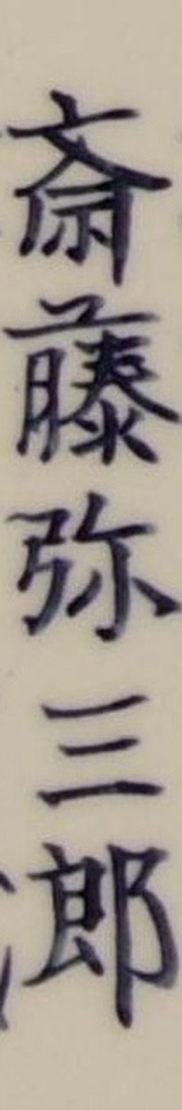斎藤弥三郎
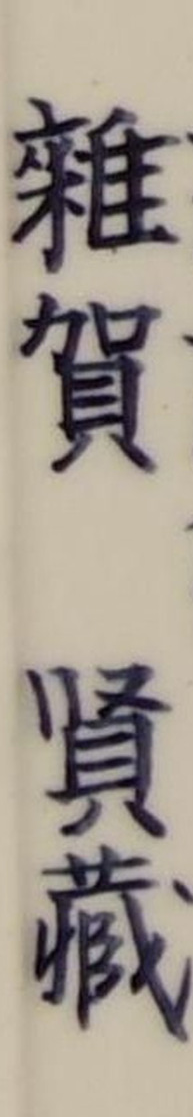雑賀賢蔵

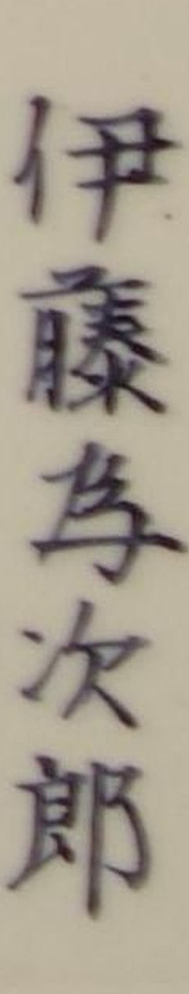伊藤為次郎
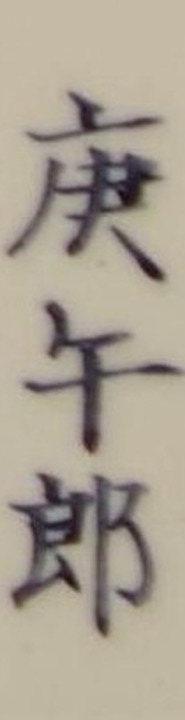庚午郎
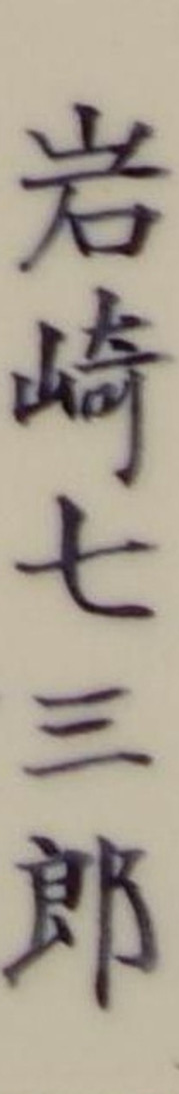岩崎七三郎
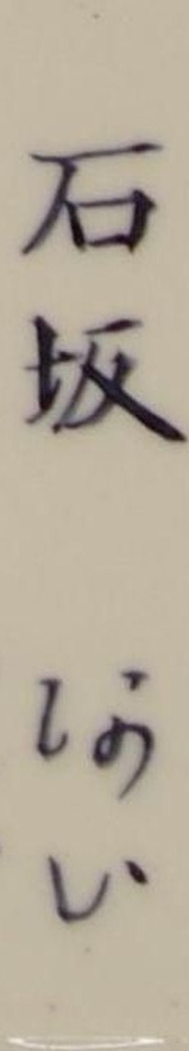石坂あい
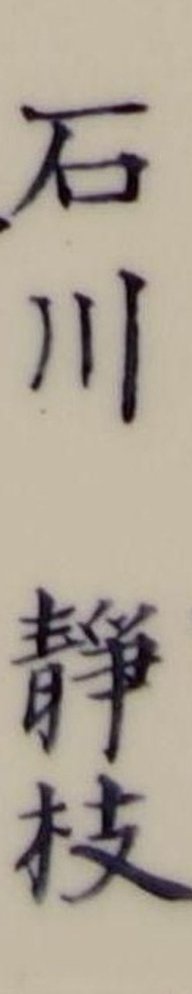石川静枝
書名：M~S
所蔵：高野山金剛峯寺
